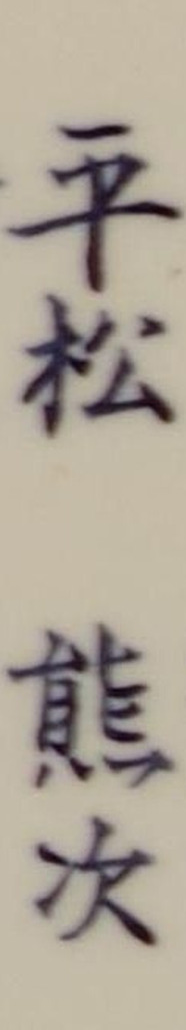平松熊次
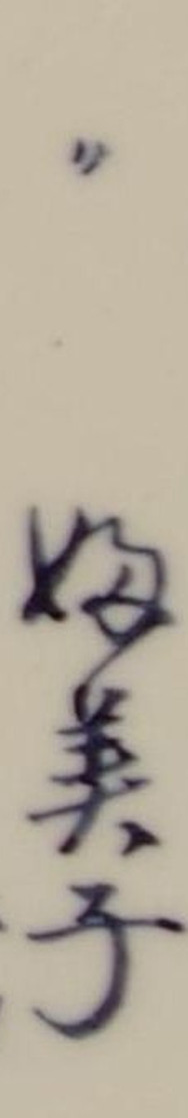ふみ子
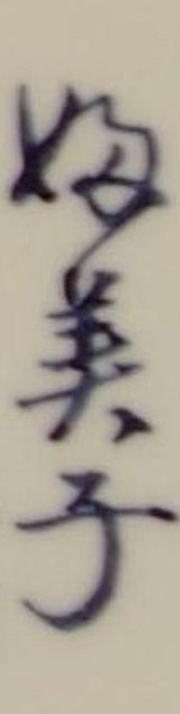ふみ子
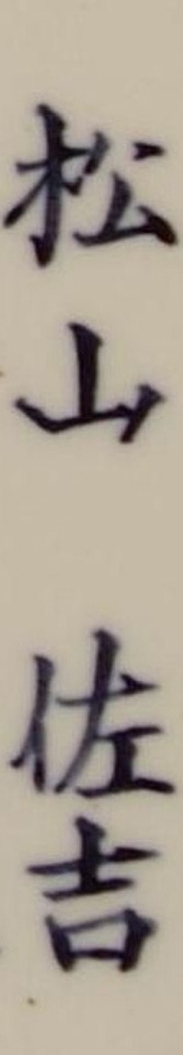松山佐吉
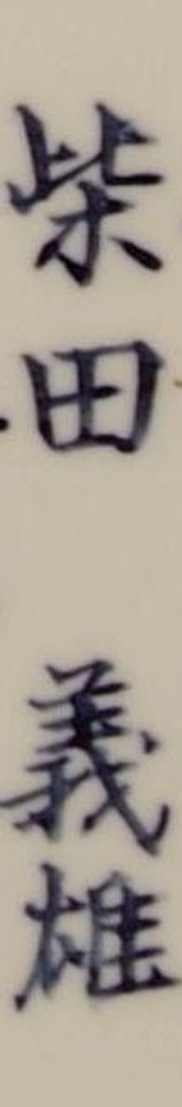柴田義雄
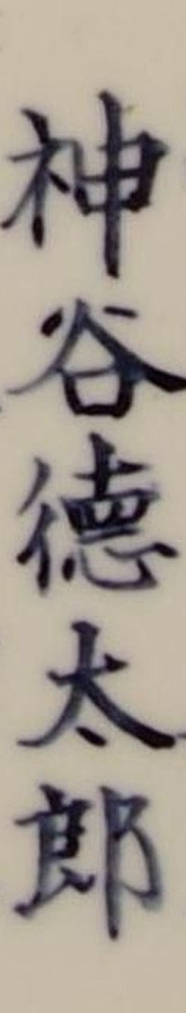神谷徳太郎
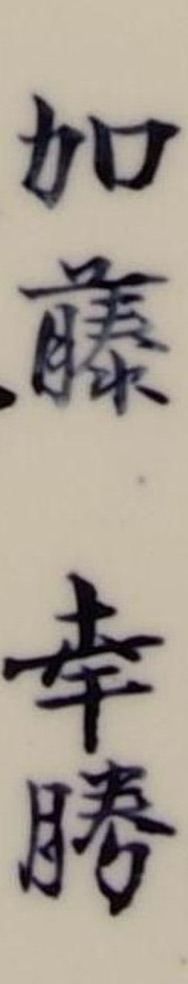加藤幸勝
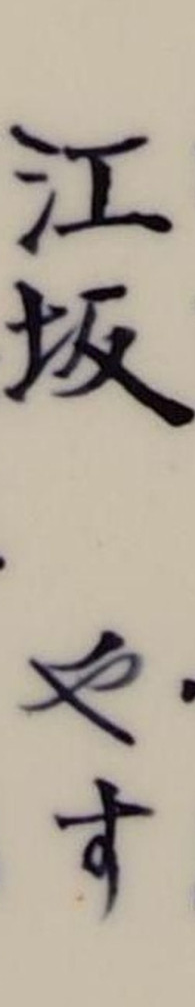江坂やす
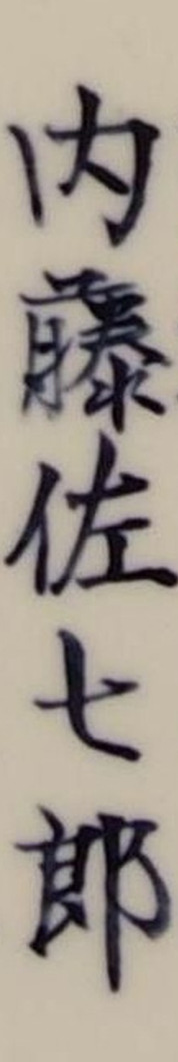内藤佐七郎
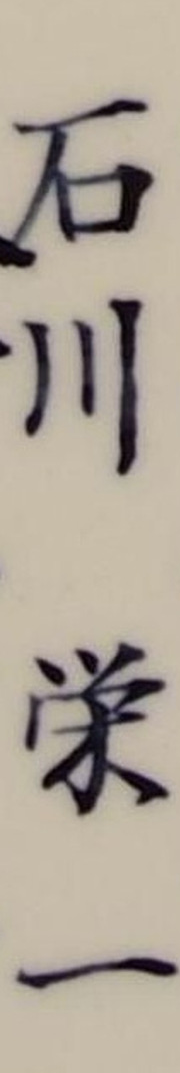石川栄一
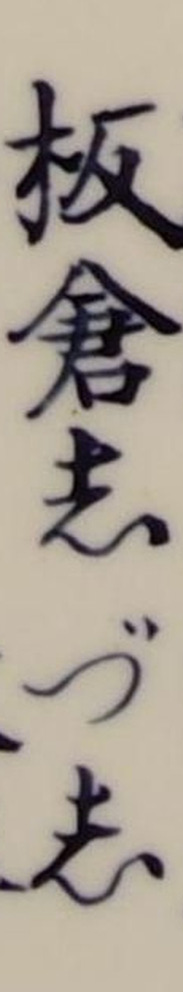板倉しづし
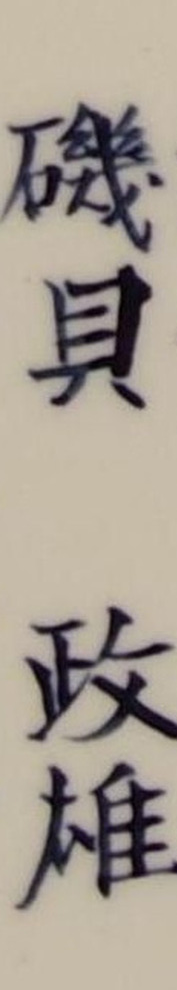磯貝政雄
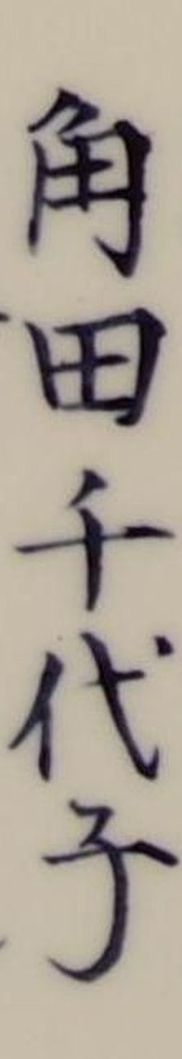角田千代子
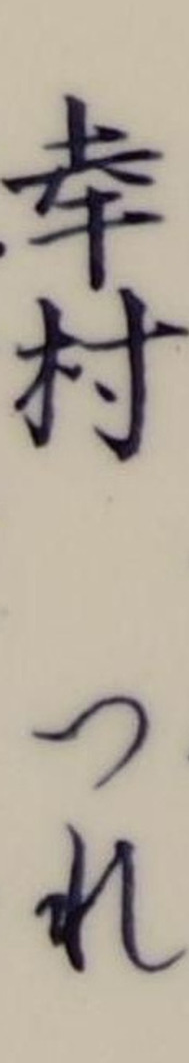幸村つれ
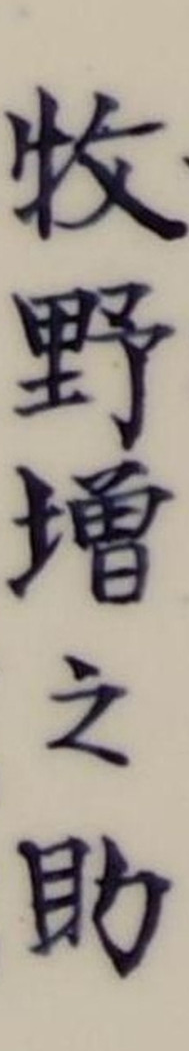牧野増之助
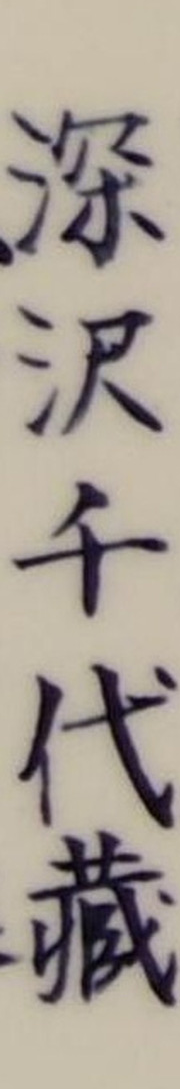深沢千代蔵
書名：M~S
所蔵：高野山金剛峯寺
